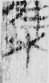集
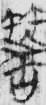箸（書）
